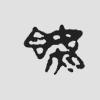氣
